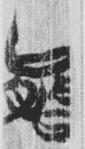能
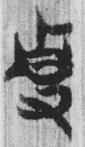○（使）
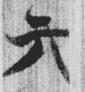亓（其）
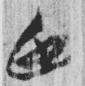臣
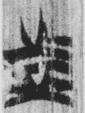者
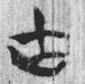古（故）
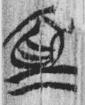爲
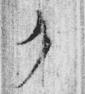人
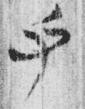父
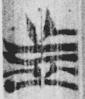者
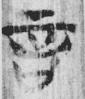言
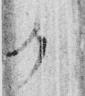人
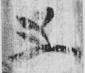之
